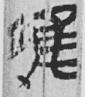○（脽）
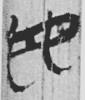母（毋）
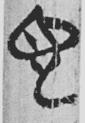見
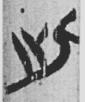此
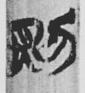○（則）
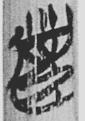○（僕）
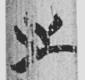之
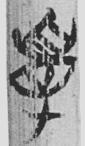辠（罪）
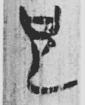也
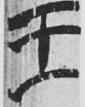王
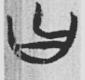曰
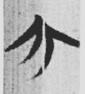大
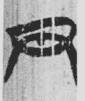尹
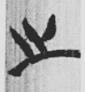之
